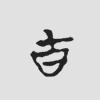吉
